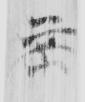不
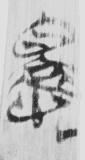懁
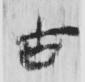古
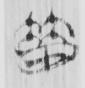昔
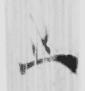之
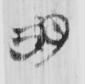明
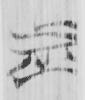者
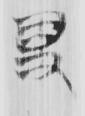𠭁
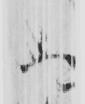之
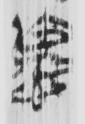{偶心}
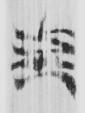者
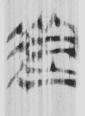{辶羊}
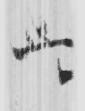之
